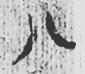八
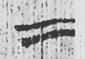二
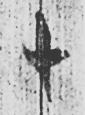十
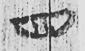四
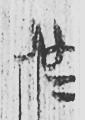廿=
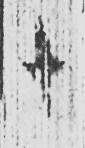十
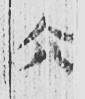六
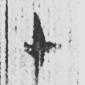十
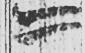二
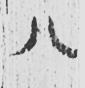八
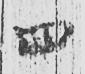四
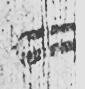二
